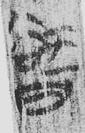智（知）
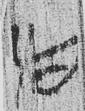左
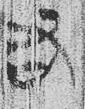右
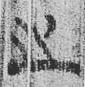之
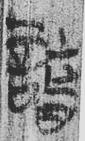請
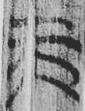天
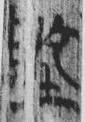○（地）
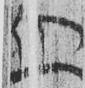立
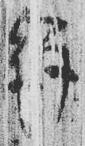終
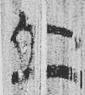立
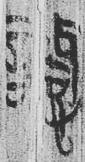○（始）
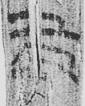天
